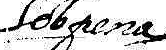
sob pena
